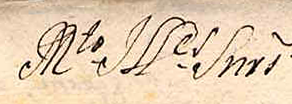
Mto Ill.es Snrs.
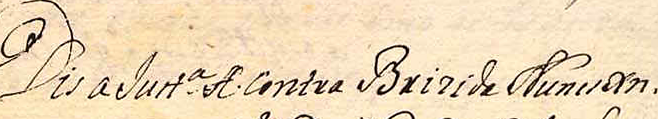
Dis a Iust.a A. contra Brizida Nunes xn.
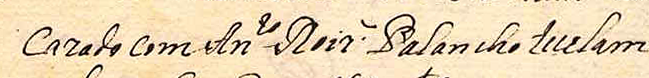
cazado com Anto Roiz̄. Palancho tecelam
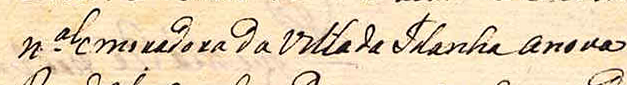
n.al e moradora da villa da Idanha a nova
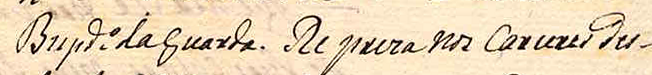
Bispd.o da Guarda. Ré preza nos carceres des
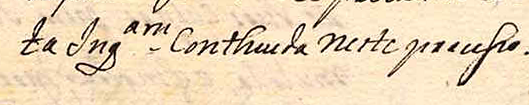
ta Inqam. contheuda neste processo.
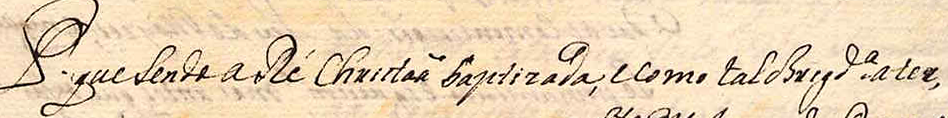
P. que sendo a Ré Christaã baptizada, e como tal obrigd.a a ter,
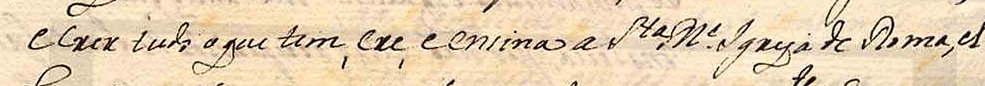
e crer tudo o que tem, cre, e ensina a Sta M.e Igreja de Roma, el
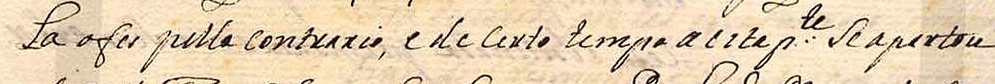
La o fes pello contrario, e de certo tempo a esta p.te se apartou
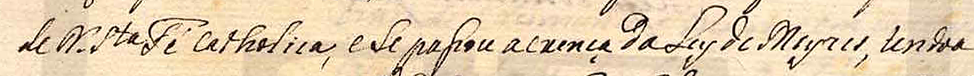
de N. sta Fé catholica, e se passou a crença da Ley de Moyzes, tendoa
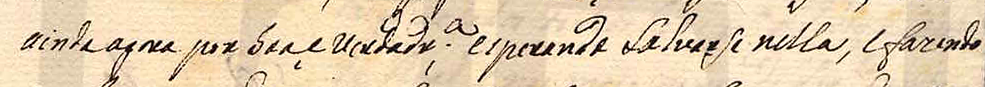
ainda agora por boa, e verdadr;a esperando salvarse nella, e fazendo
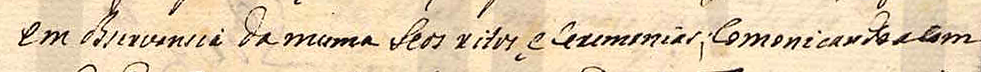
em observancia da mesma seos ritos, e Ceremonias; Comonicando a com
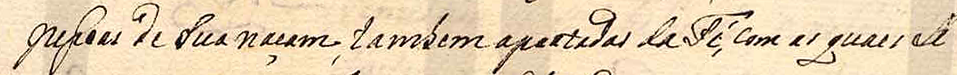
pessoas de sua naçam, tambem apartadas da Fé, com as quaes se
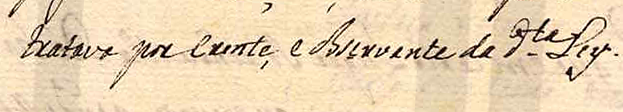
tratava por crente, e observante da d.ta Ley.
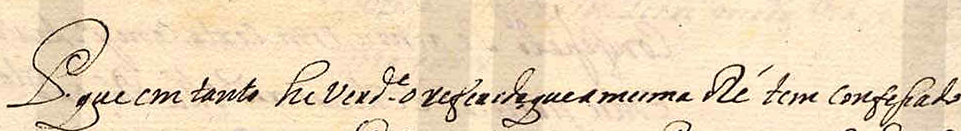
P. que em tanto he verd.e o referido, que a mesma Ré tem confessado
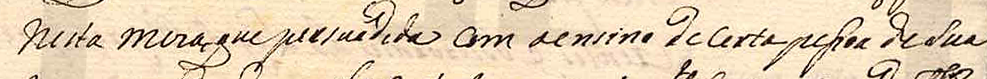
nesta meza, que persuadida com o ensino de certa pessoa de sua
